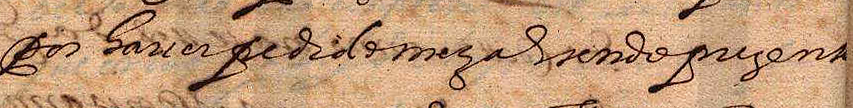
por hauer pedido meza E sendo prezente
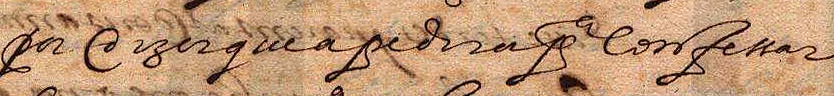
por dizer que a pedira pa confessar
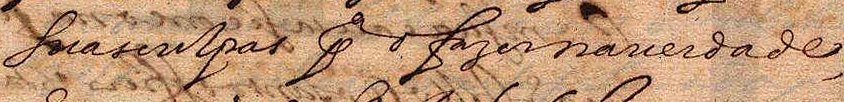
suas culpas pa o fazer na uerdade
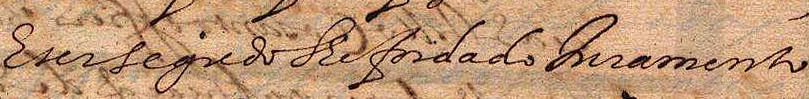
E ter segredo lhe foi dado Juramento
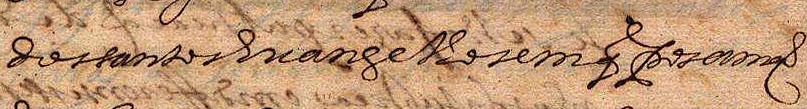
dos santos Euangelhos em q̄ pos a maõ
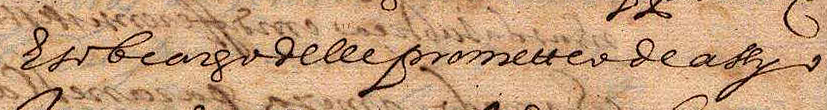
E sob cargo delle prometteo de assy o
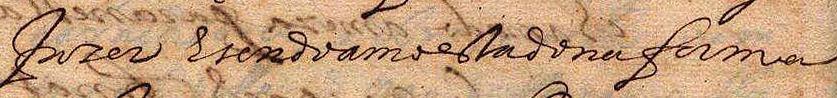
fazer, E sendo amoestado na forma
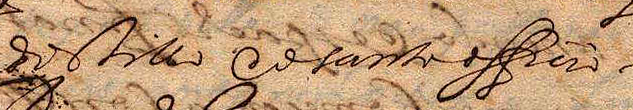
do stillo do santo officio.
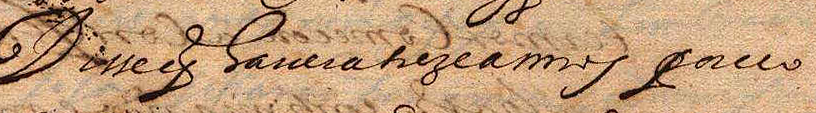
Disse q̄ hauera treze annos pouco
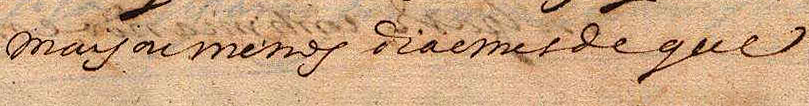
mais ou menos dia e mes de que
